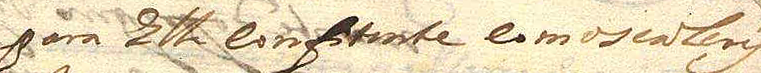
para Elle confitente com os calçois
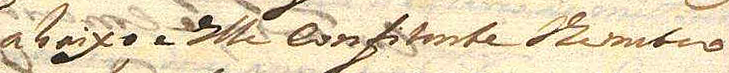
abaixo, e Elle confitente lhe meteo
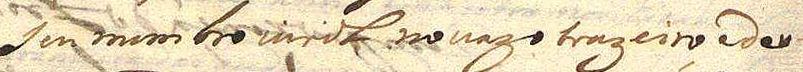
seu membro uiril no uazo trazeiro, e der
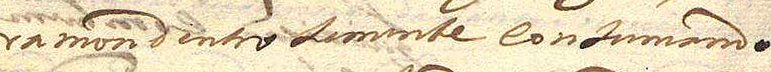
ramou dentro semente consumando
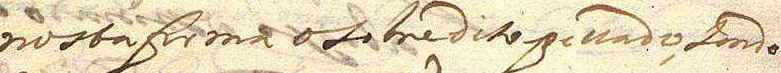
nesta forma o sobredito peccado, sendo
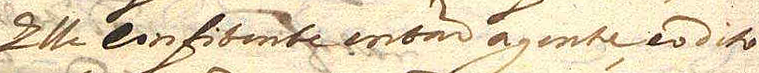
Elle confitente entaõ agente, e o dito
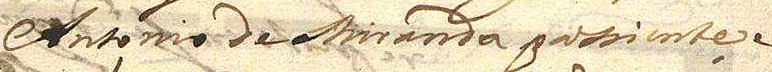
Antonio de Miranda passiente, e
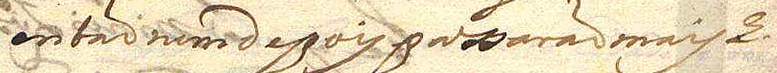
entaõ nem depois passaraõ mais E
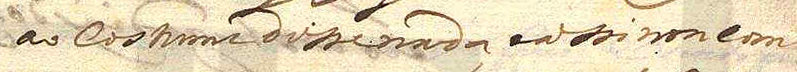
ao costume disse nada, e assinou com
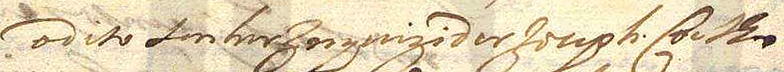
o dito senhor Jnquizidor Jozeph. Coelho
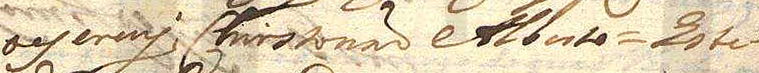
o escreuj Christouaõ Alberto = Este
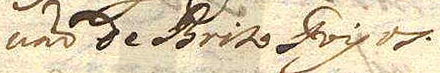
uaõ de Brito Foyos.
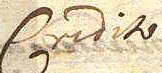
Credito
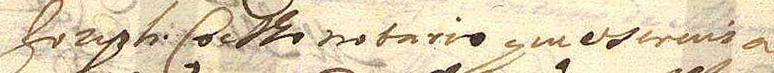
Jozeph. Coelho notario que escreui a
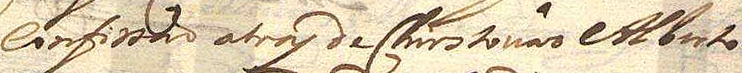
confissaõ atras de Christouaõ Alberto
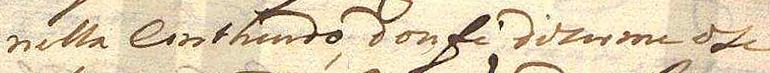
nella contheudo, dou fé dizerme o se
